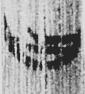曰
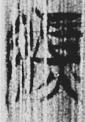○（繕）
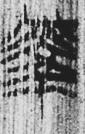○（甲）
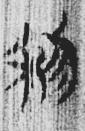利
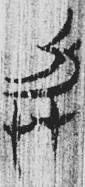兵
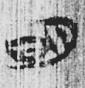明
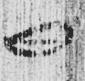日
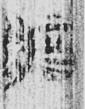𨟻（將）
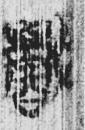○（戰）
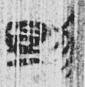則
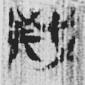斯（廝）
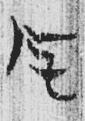厇（徙）
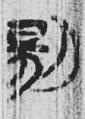{昜刀}（煬）
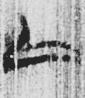亡
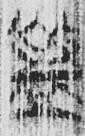盤
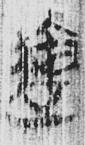○（就）
